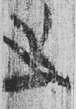之
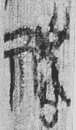神
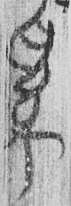○（奚）
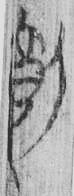飤（食）
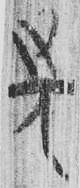先
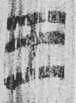王
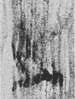之
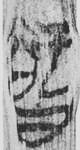智
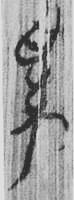○（奚）
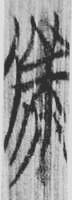備
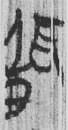○（聞）
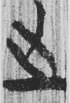之
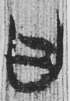曰
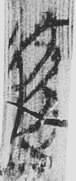逐
